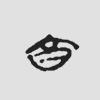亯
